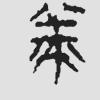備
